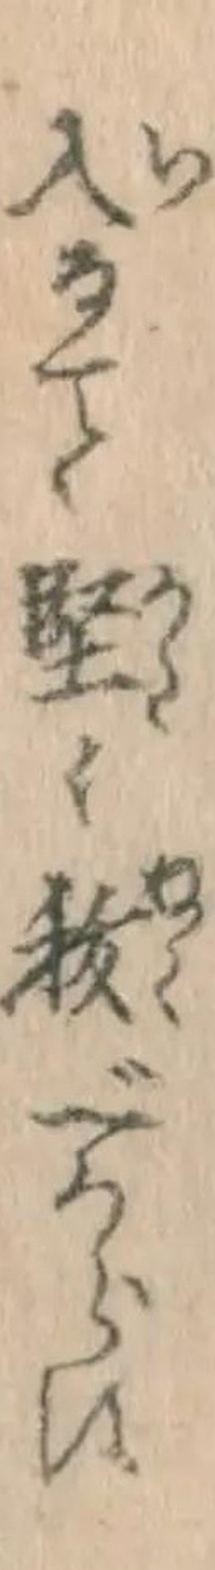入ること堅くべからす
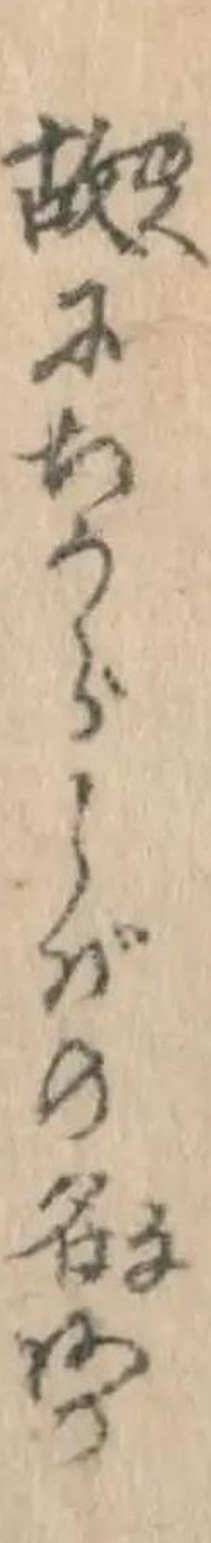故にちからしばの名あり
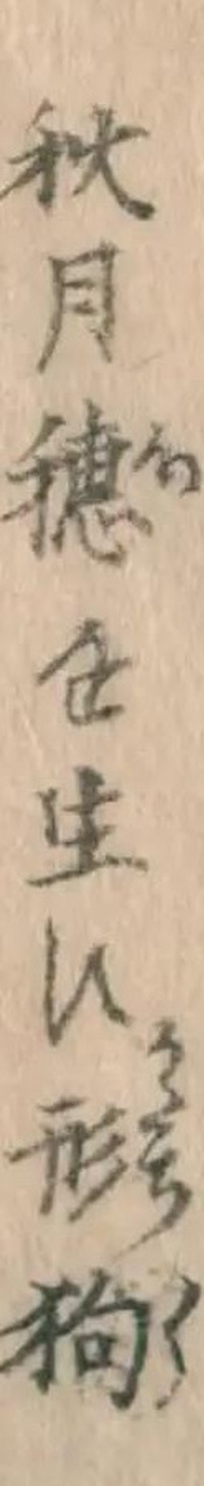秋月穂を生す形狗
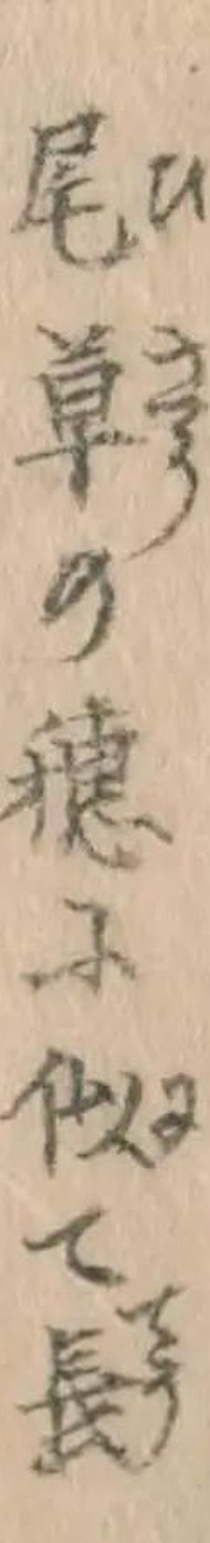尾草の穂に似て長
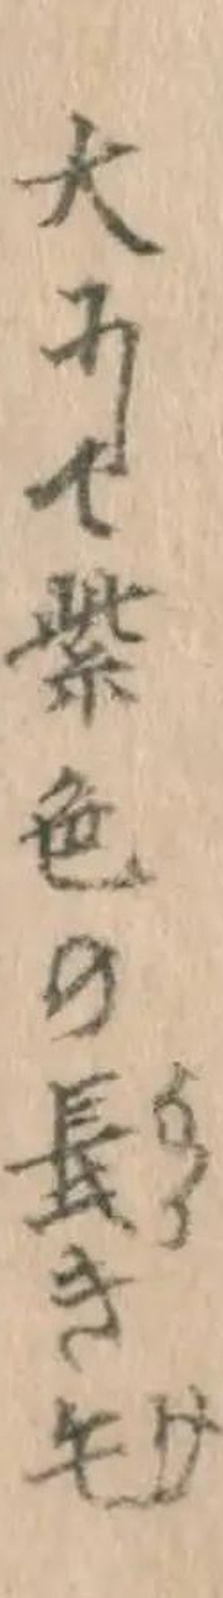大にして紫色の長き毛
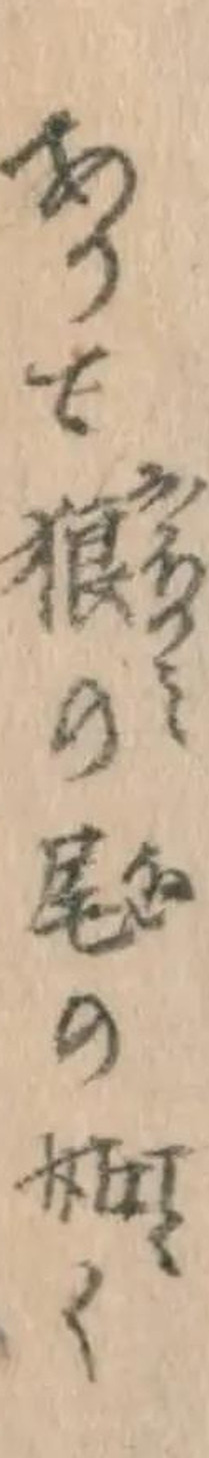ありて狼の尾の如く
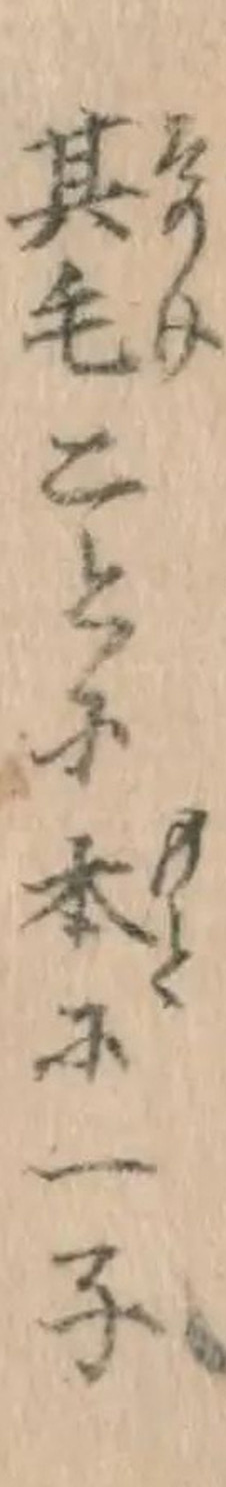其毛ことに本に一子
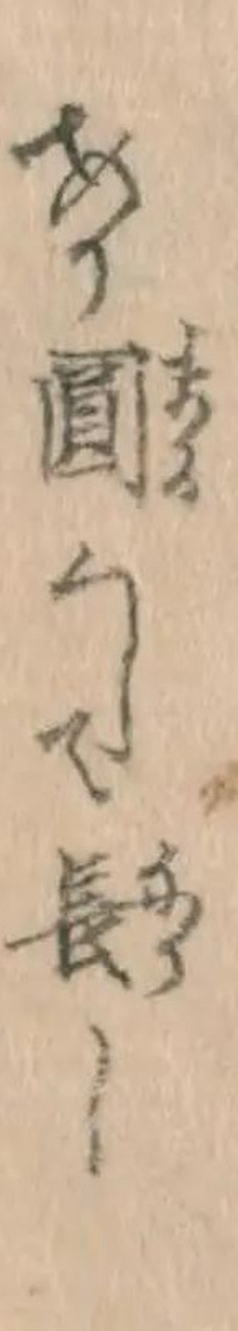あり円くして長し
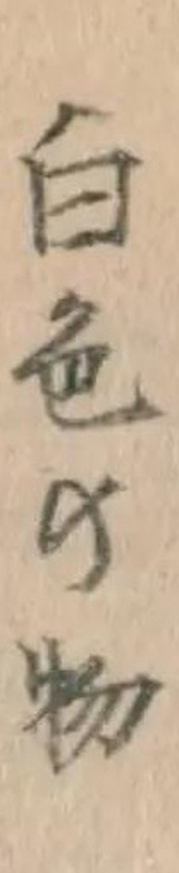白色の物

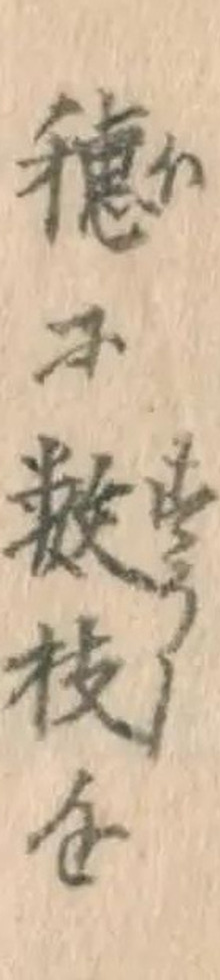穂に数枝を
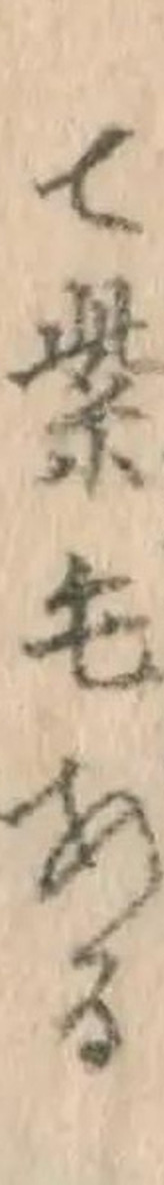て紫毛ある

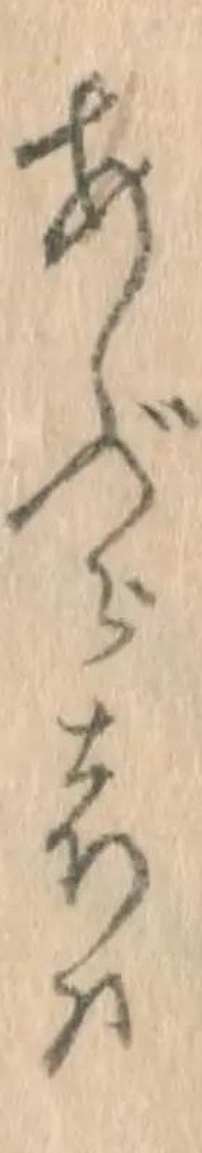あぶらしは
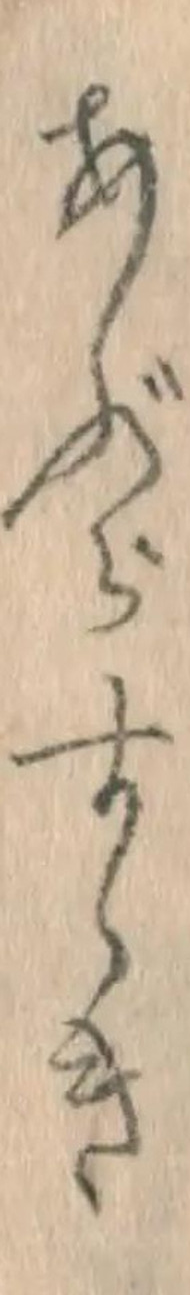あぶらすゝき
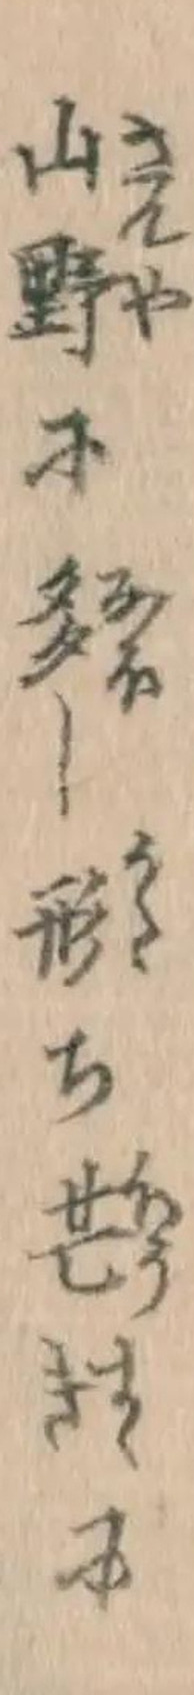山野に多し形ち芒すゝきに
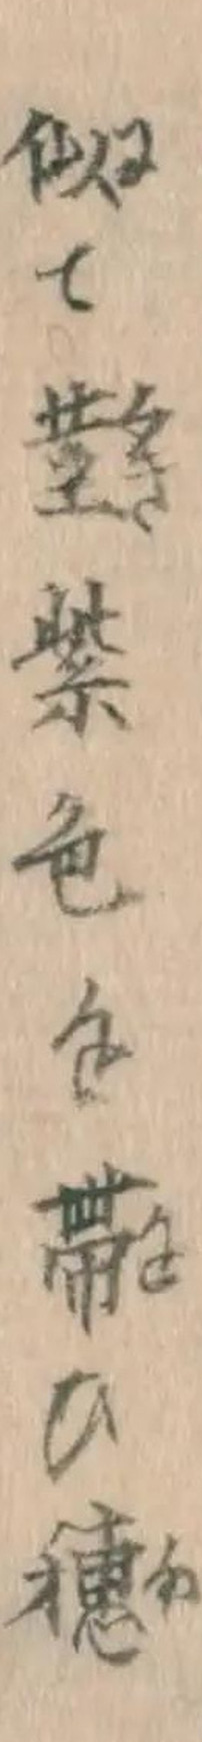似て茎紫色を帯ひ穂
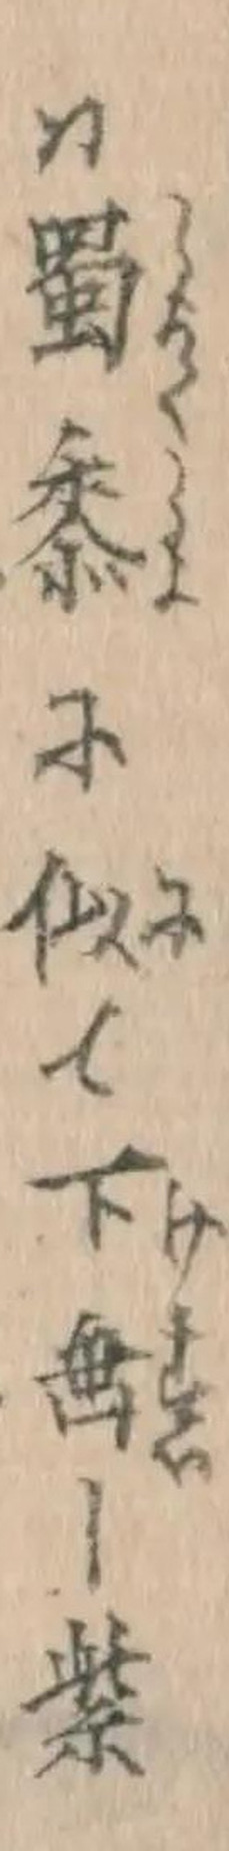は蜀黍に似て下垂し紫
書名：本草図譜. 巻40-42
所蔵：国立国会図書館 National Diet Library, JAPAN
